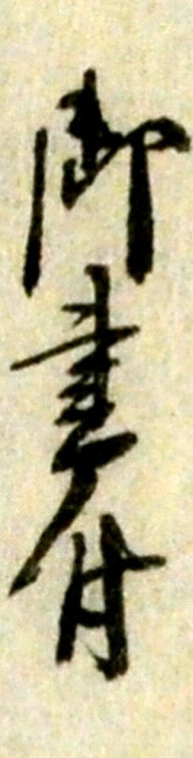御書付
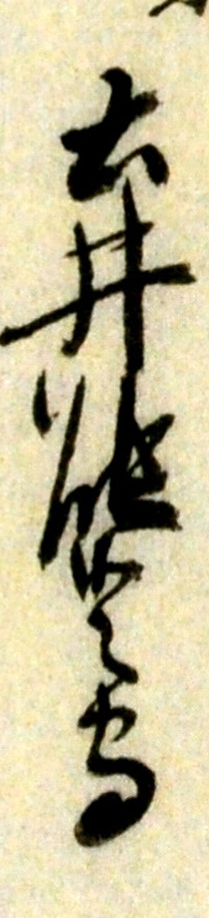土井能登守
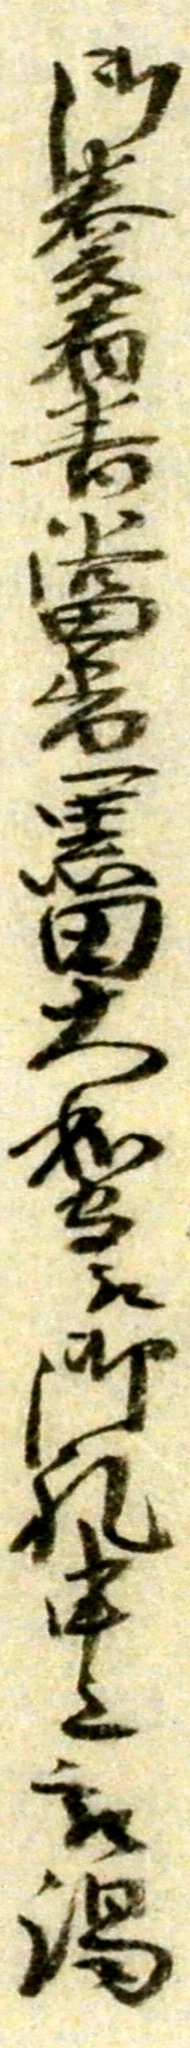御奏者番黒田大和守江御礼申上被謁
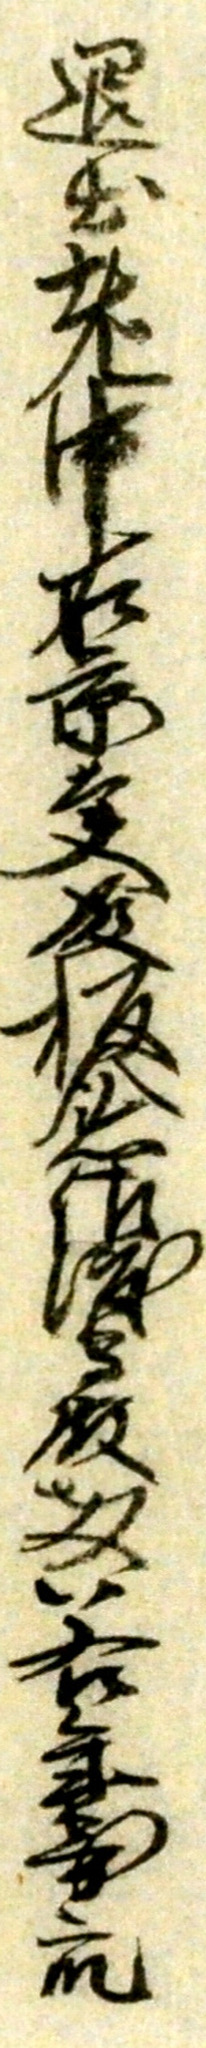退出老中右京太夫殿板倉佐渡守殿両若年寄衆
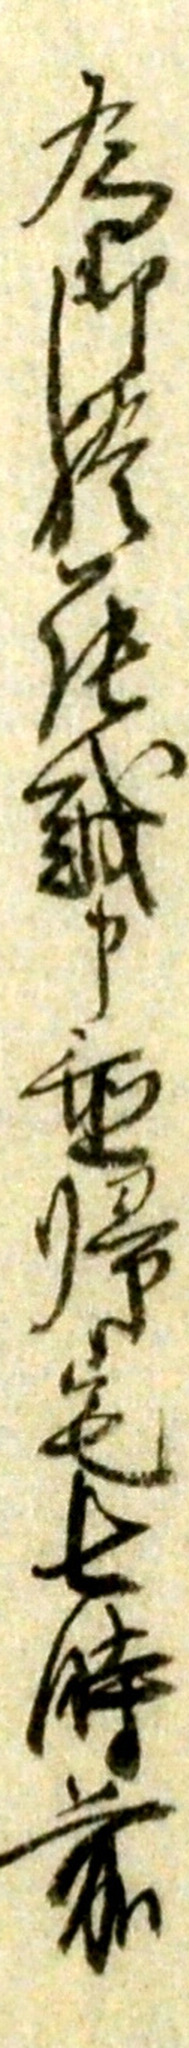為御礼罷越申置帰宅七時前
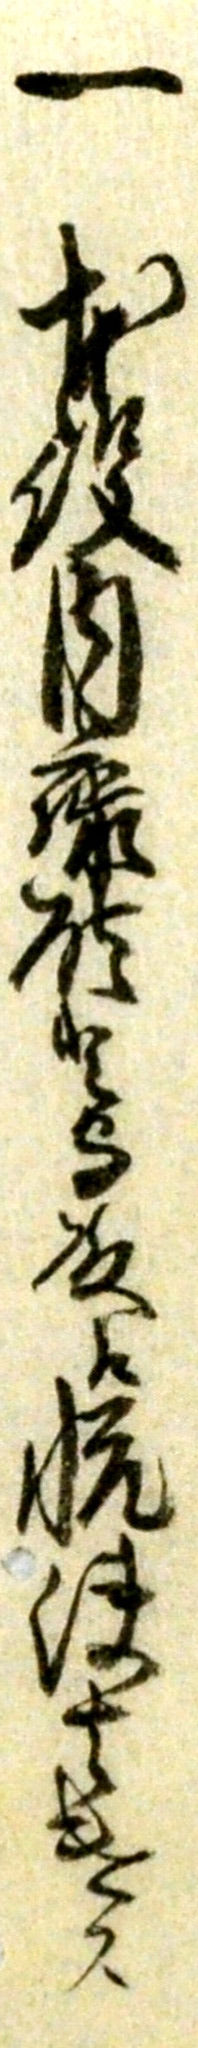一本役内藤能登守殿江悦使者遣ス

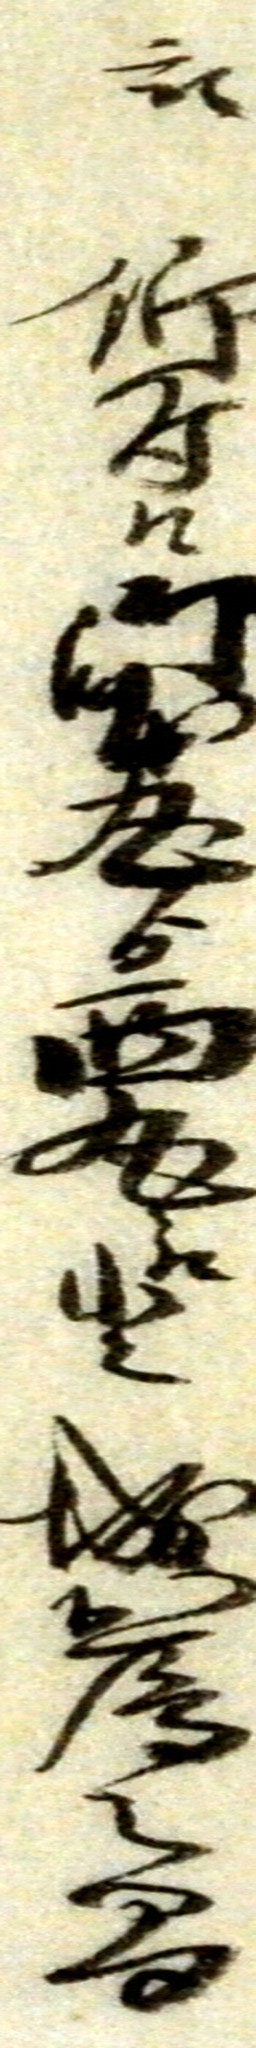被仰付候御本丸ゟ西丸江登城雁ノ間
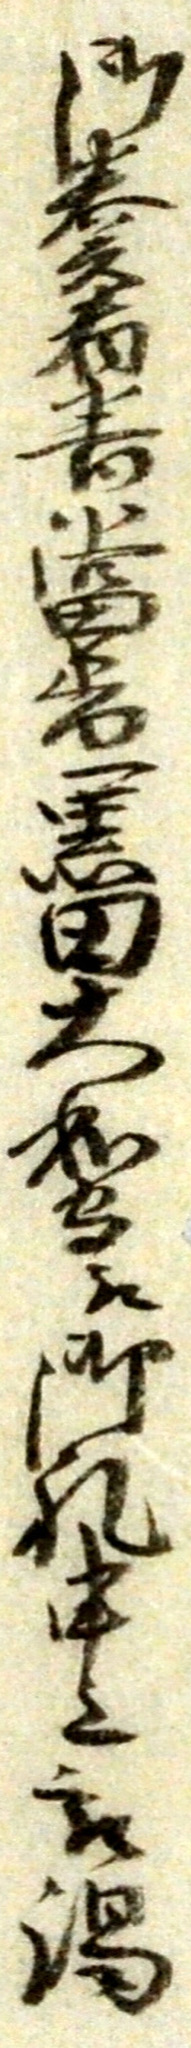御奏者番当番黒田大和守江御礼申上被謁
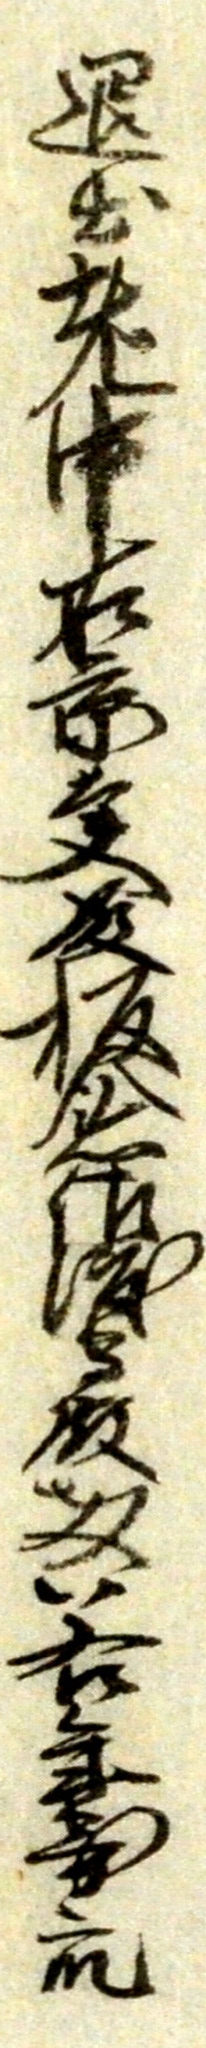退出老中右京太夫殿板倉佐渡守殿両若年寄衆
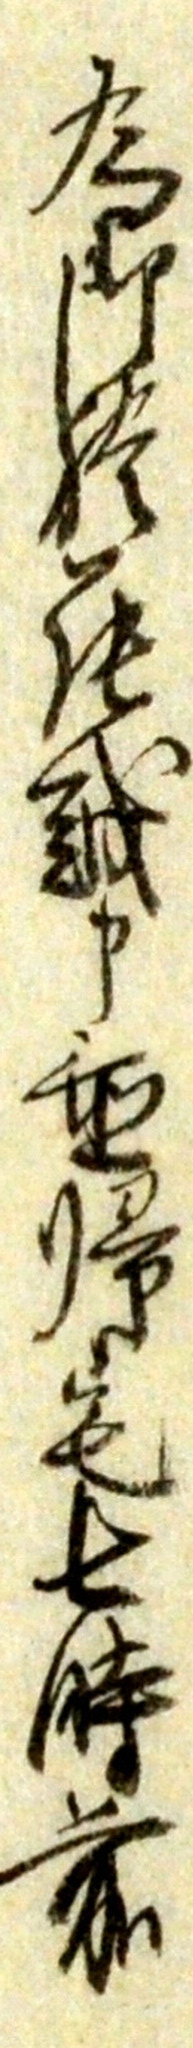為御禮罷越申置帰宅七時前
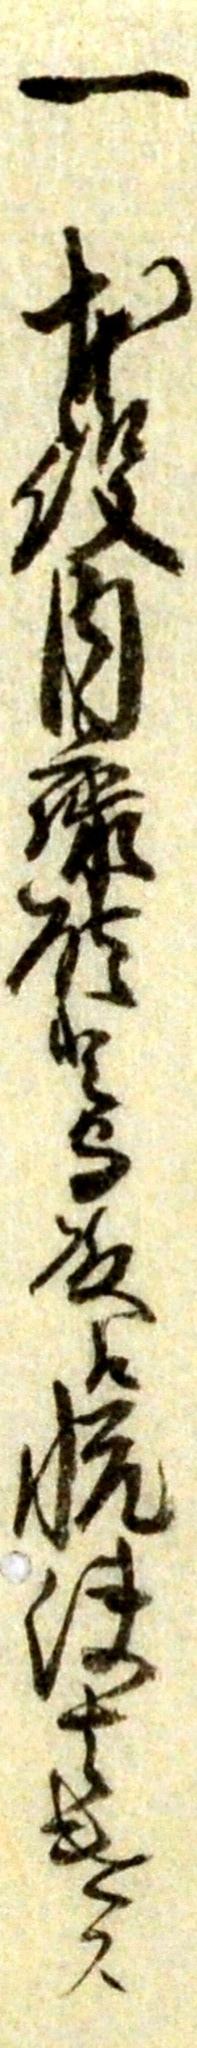一本役内籐能登守殿江悦使遣ス
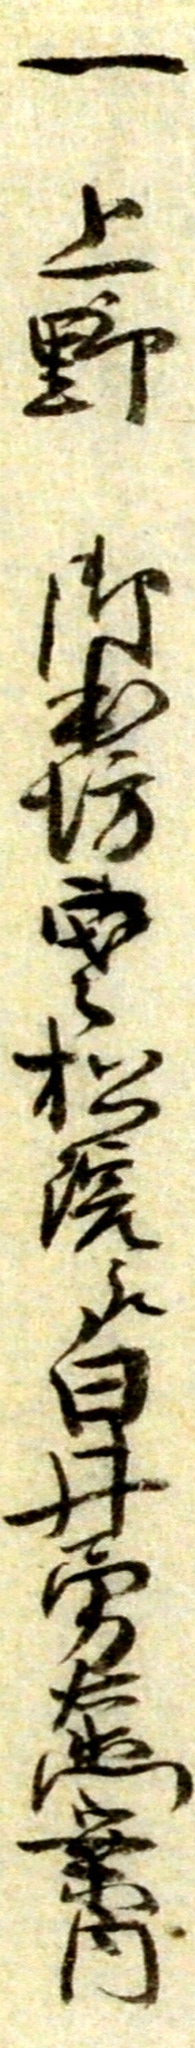一上野御本坊寒松院江白井勇右衛門案内
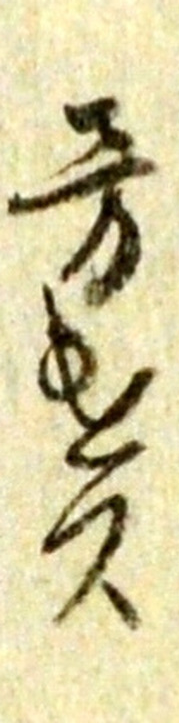旁遣ス
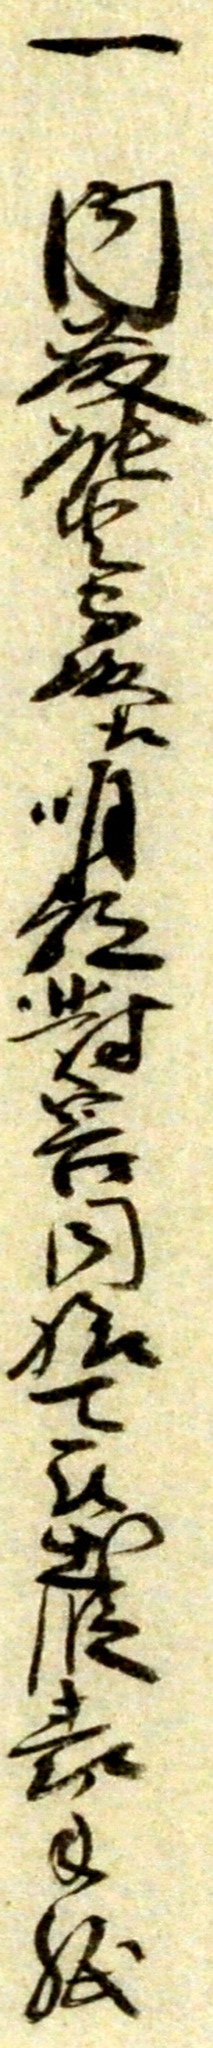一内藤能登守殿江明朝対客同様可罷出段表手紙
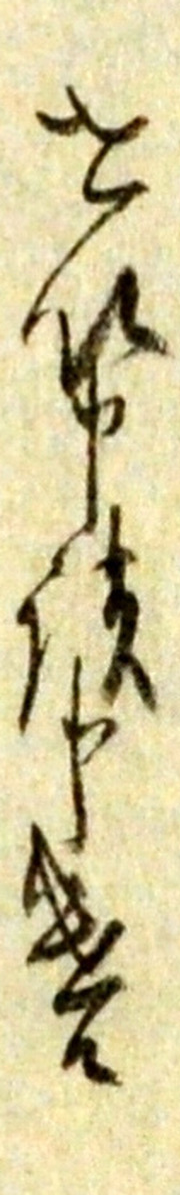を以申談申遣候
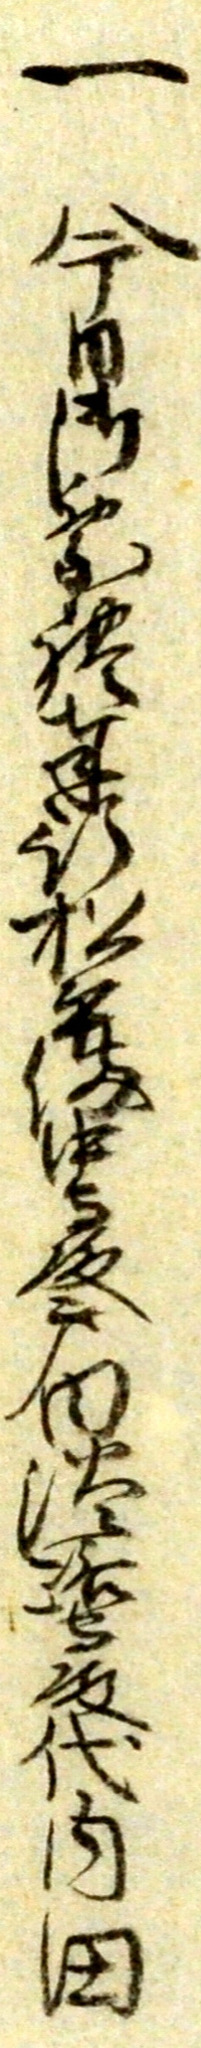一今日御祭礼奉行松平備中守殿戸田淡路守殿代内田
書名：日光御名代相勤候節ノ留
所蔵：伊那市立高遠町図書館・合同会社AMANE
